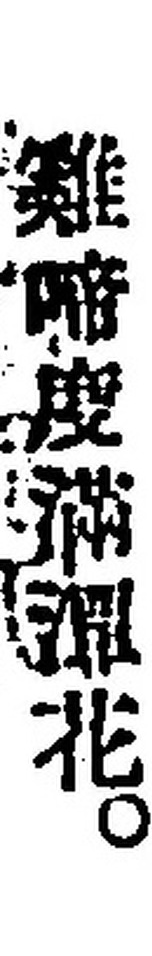雞啼度満潭花。
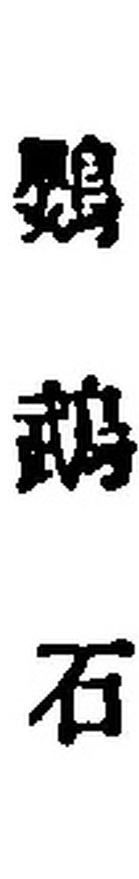鸚鵡石
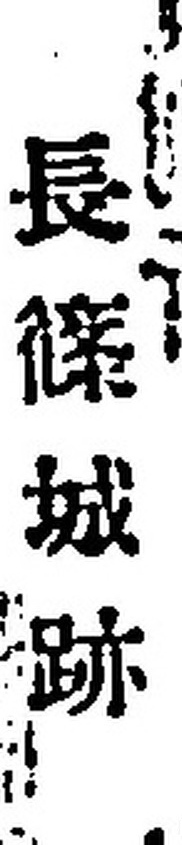長篠城跡
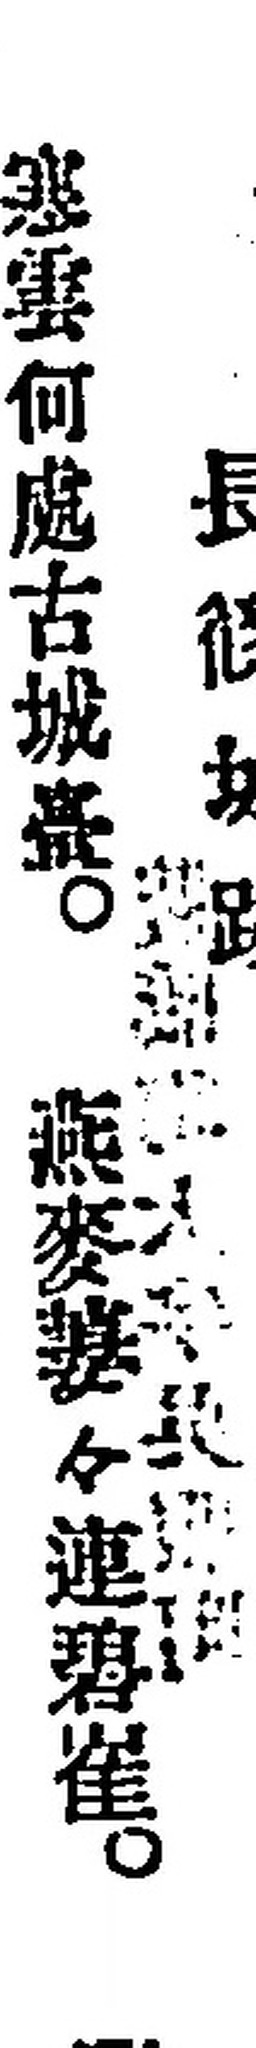寒雲何処古城台。燕麦萋々連碧崔。蛮触
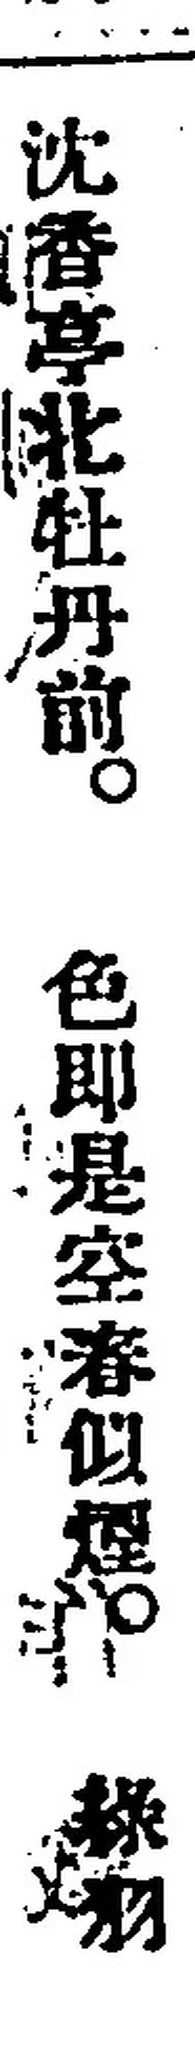沈香亭北牡丹前。色即是空春似煙。緑羽
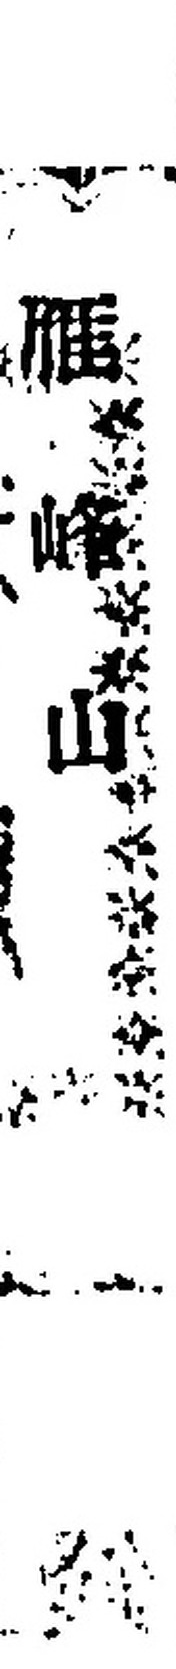雁峰山
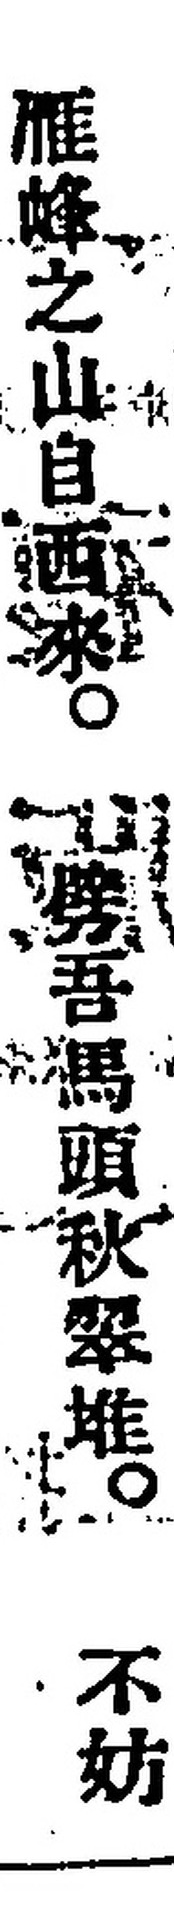雁峰之山自西来。劈吾馬頭秋翠堆。不妨
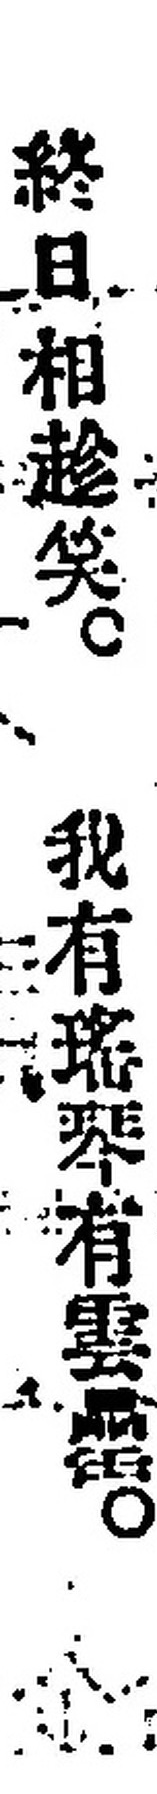終日相趁笑。我有瑤琴有雲罍。
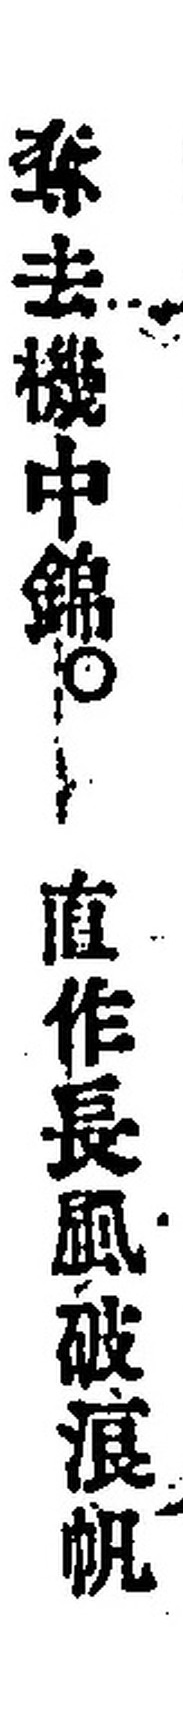奪去機中錦。直作長風破浪帆
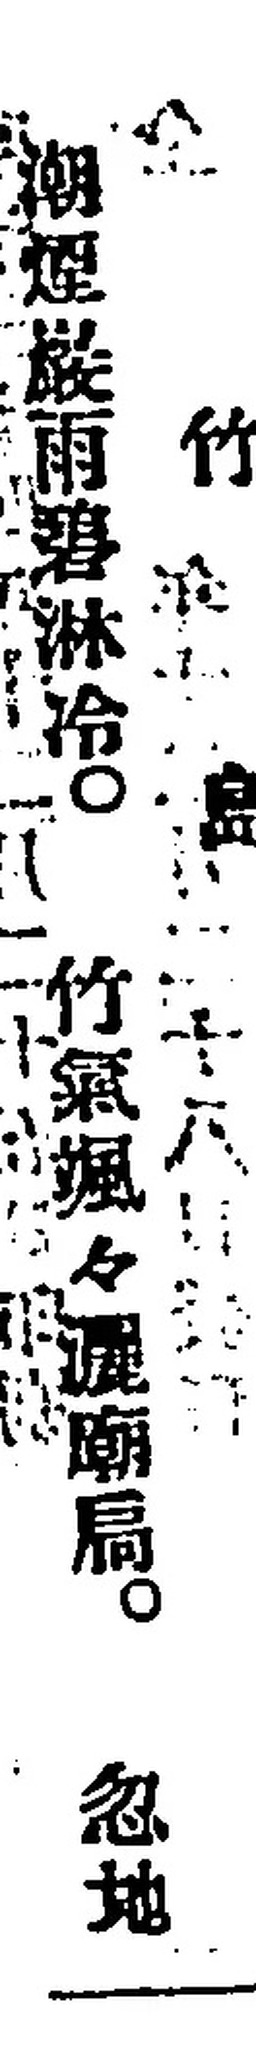潮煙巌雨碧淋冷。竹気颯々灑廟扃。忽地

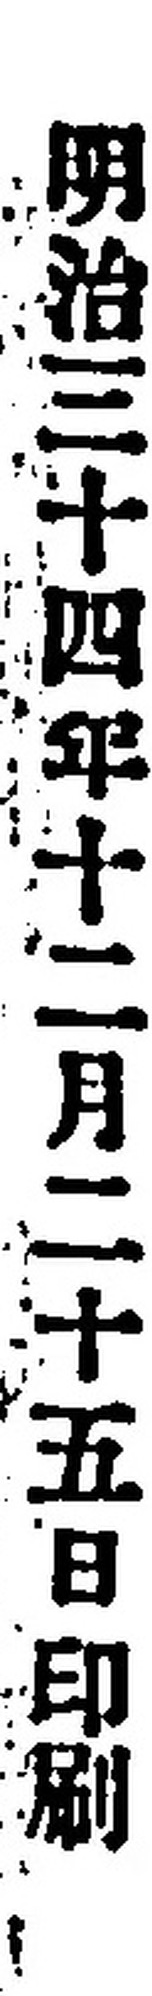明治三十四年十二月二十五日印刷
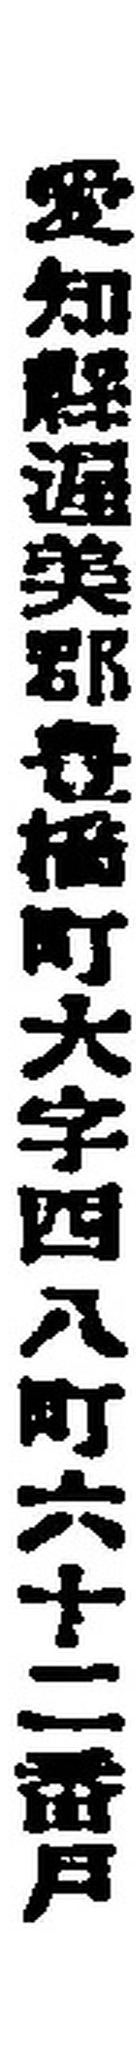愛知県渥美郡豊橋町大字西八町六十二番戸
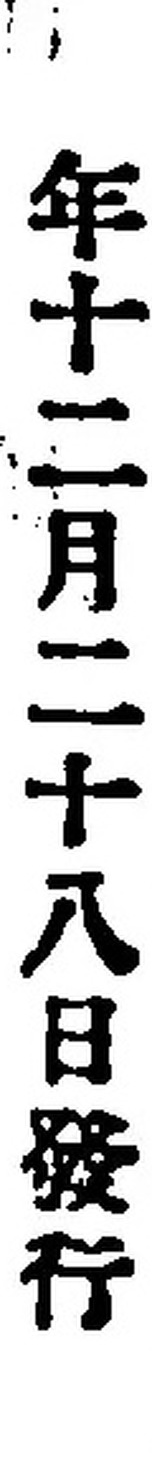仝年十二月二十八日発行
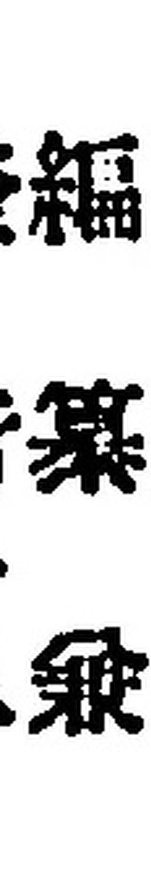編纂兼
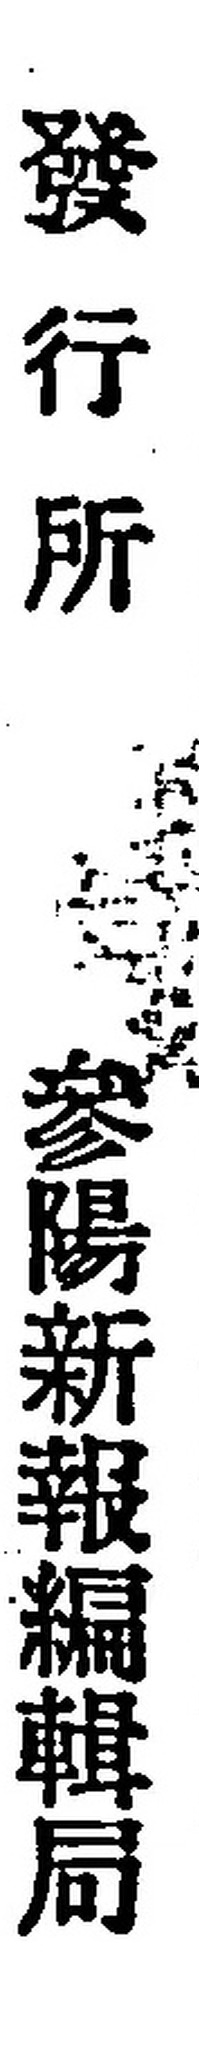発行所参陽新報編輯局
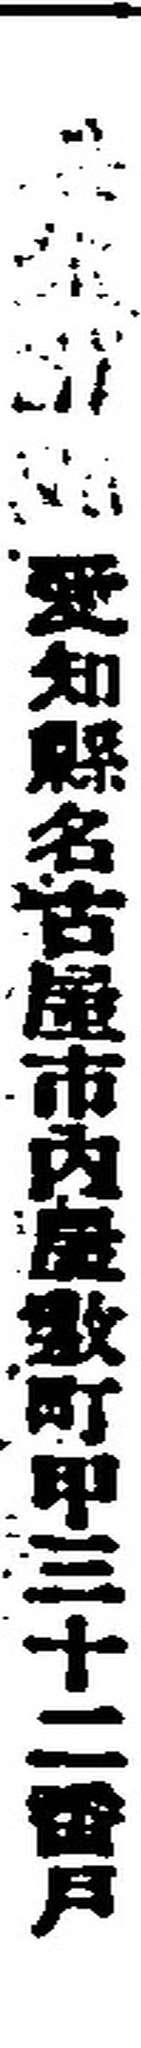愛知県名古屋市内屋敷町甲三十二番戸
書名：東参名勝案内
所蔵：国立国会図書館 National Diet Library, JAPAN
